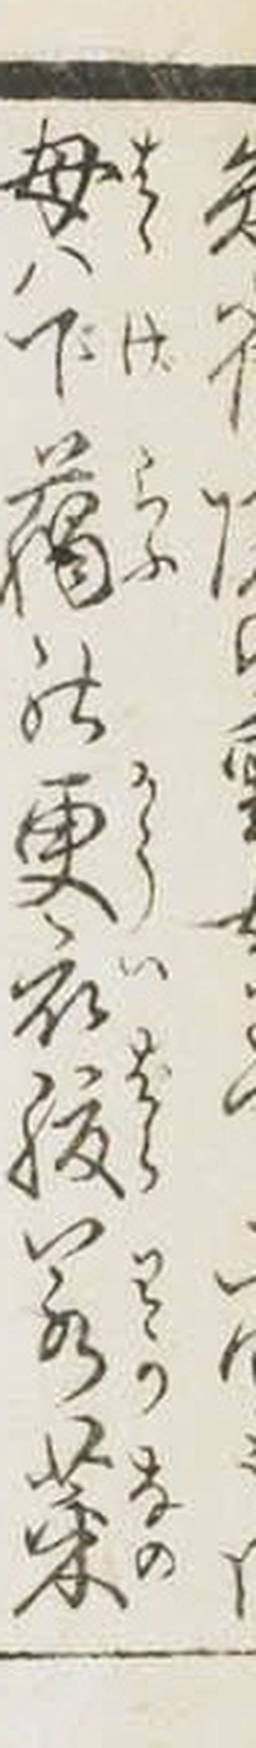母は下﨟の更衣腹若菜
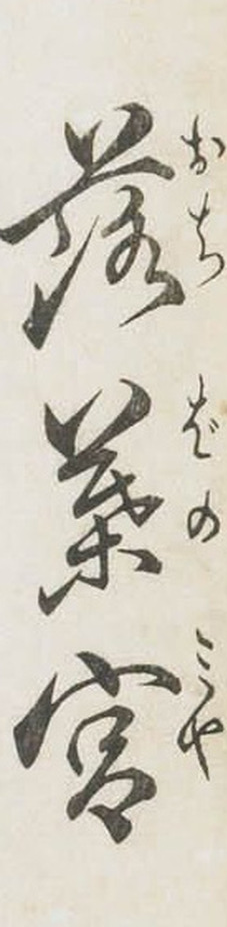落葉宮
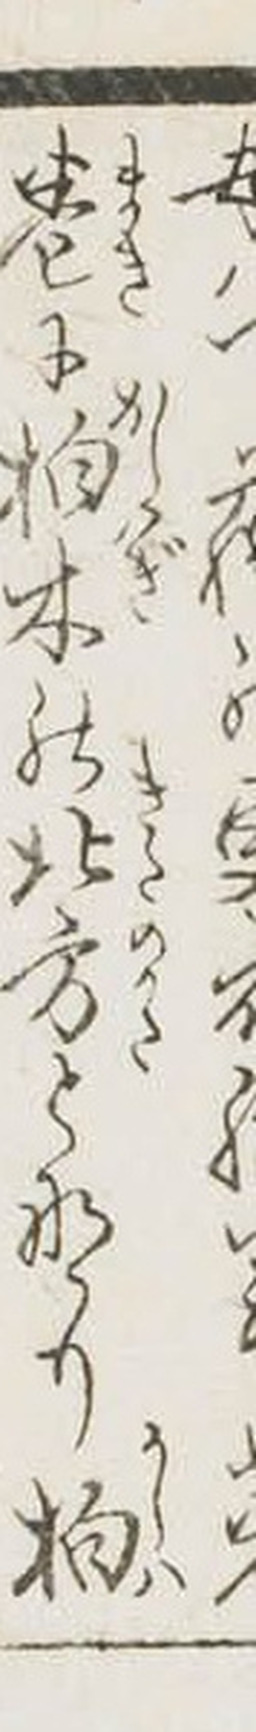巻に柏木の北方となり柏
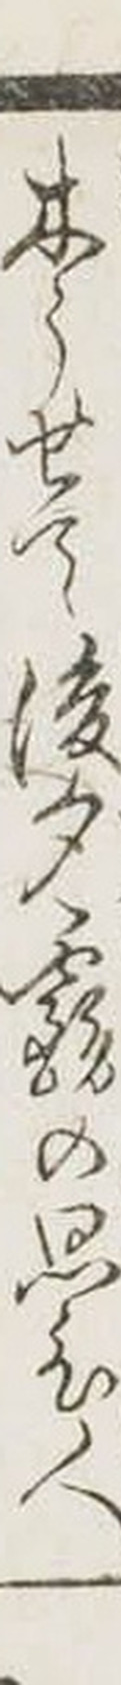木うせて後夕霧の思ひ人
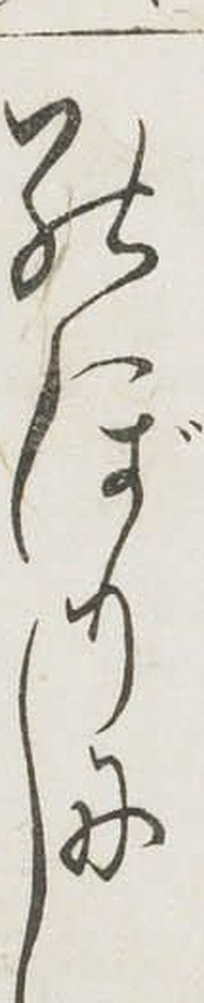のぼりにし
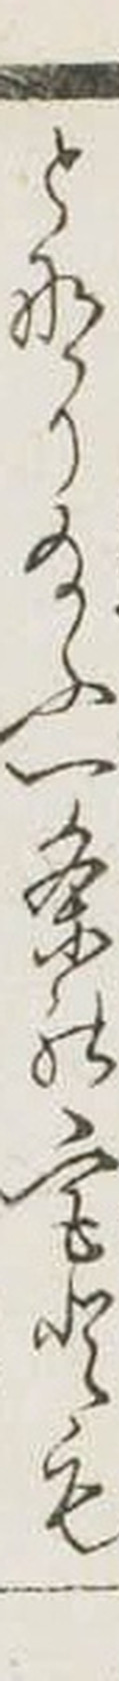となり給ふ一条の宮とも
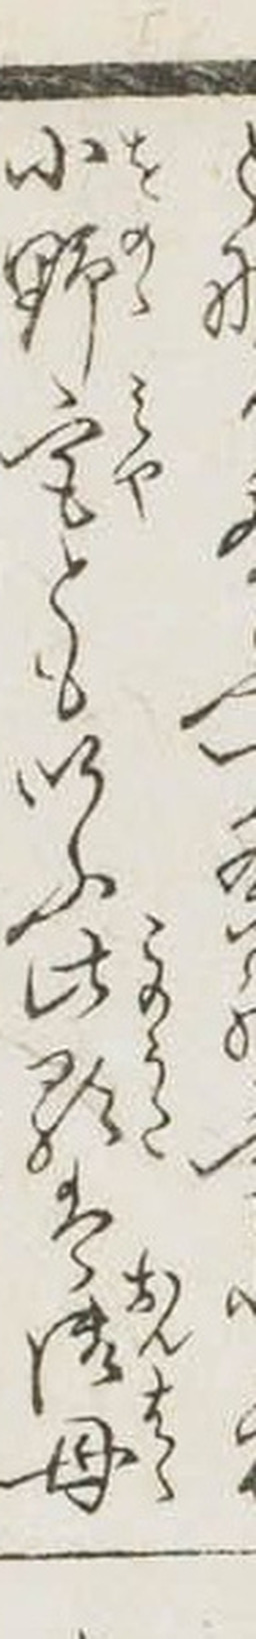小野宮ともいふ此歌は御母
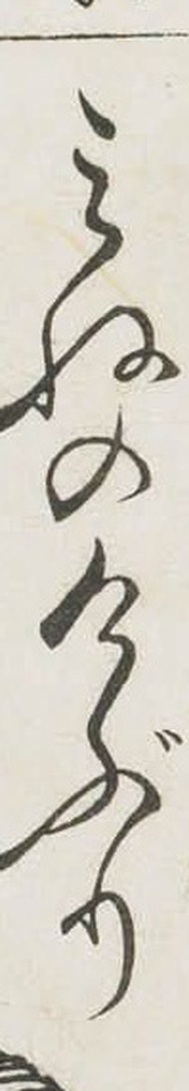みねのけぶり
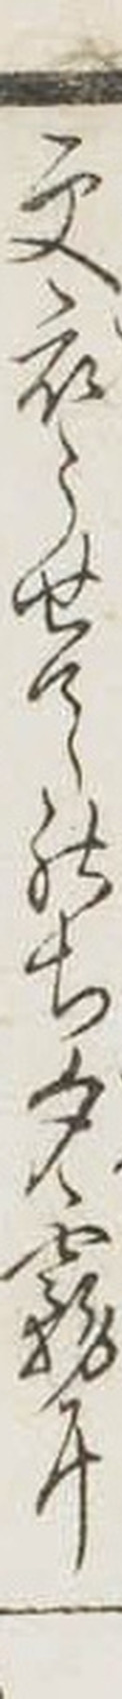更衣うせてのち夕霧に
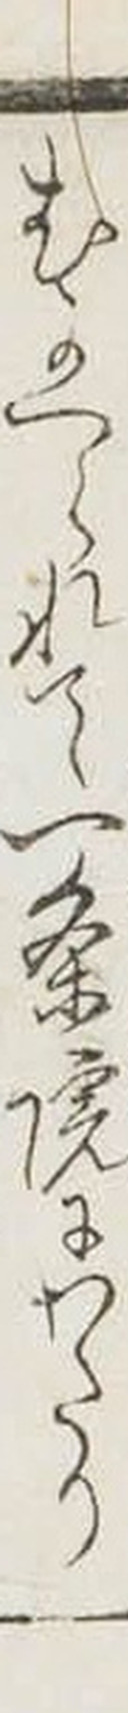むかへられて一条院にわたり
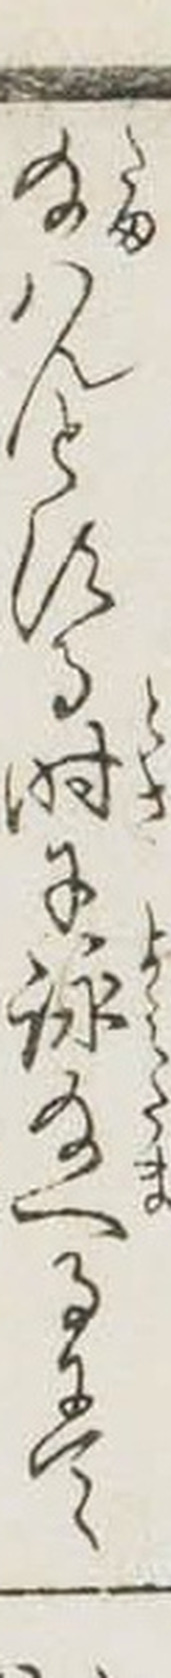給はんとする時に詠給へるにて
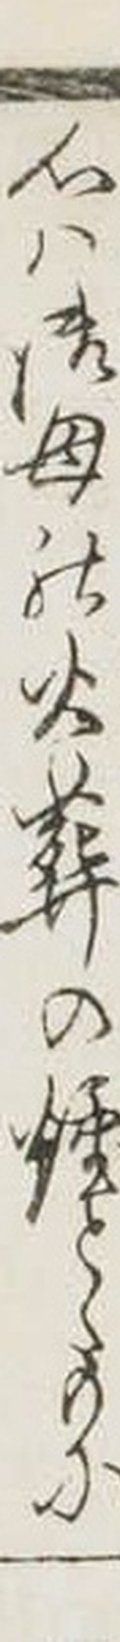心は御母の火葬の煙ともに
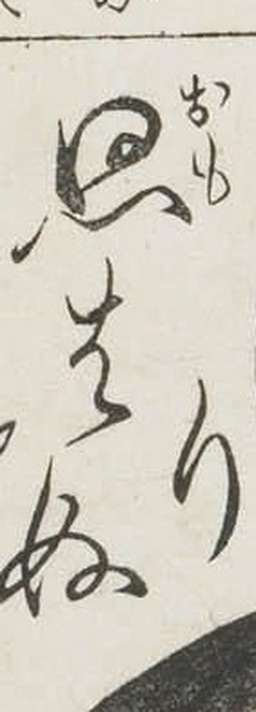思はぬ
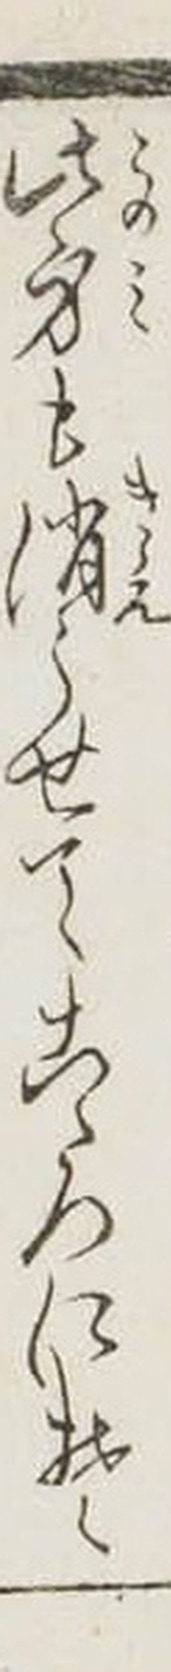此身も消うせてこゝろにそ
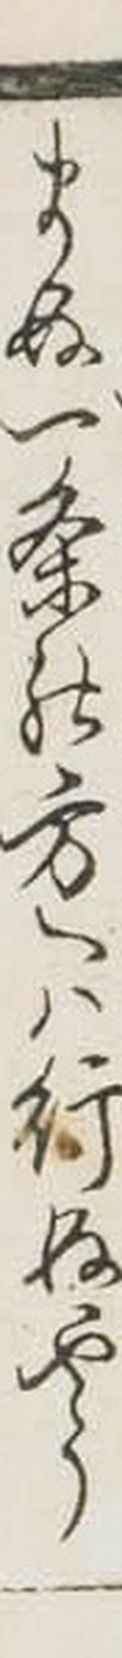まぬ一条の方へは行ぬやう
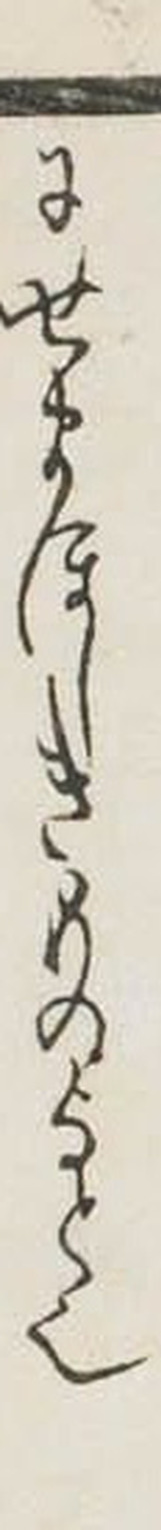にせまほしきものよと也
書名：源氏百人一首
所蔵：東京学芸大学教育コンテンツアーカイブ
